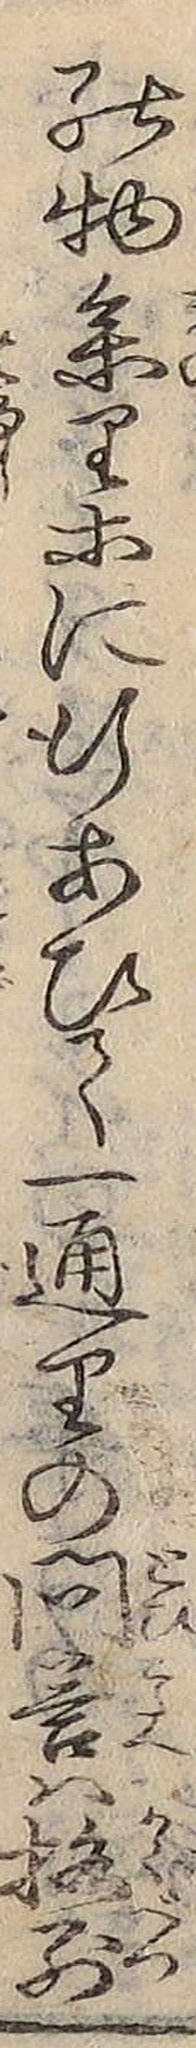の物参り等に行あひて一通りの問答は格別
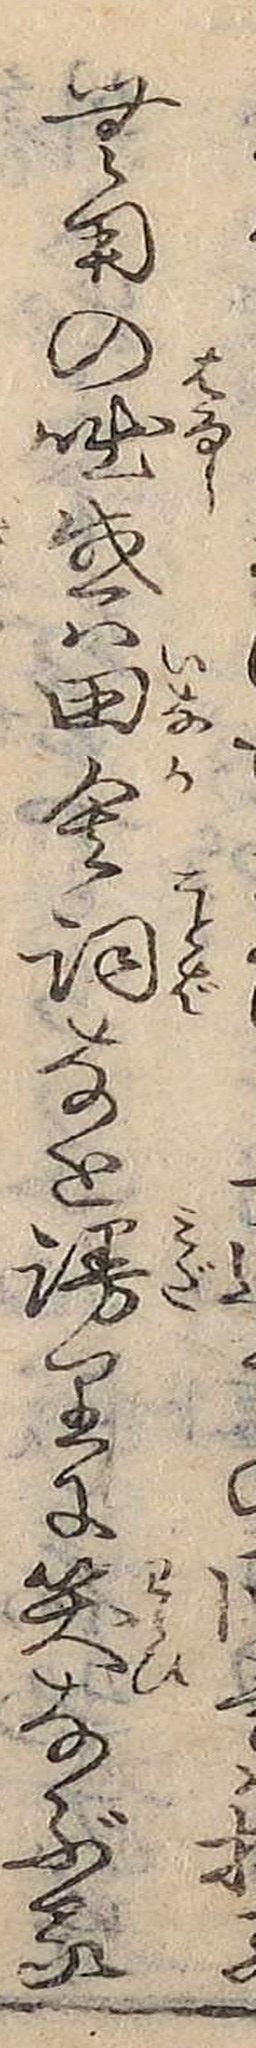無用の咄或は田舎詞なと漫りに笑なぶる
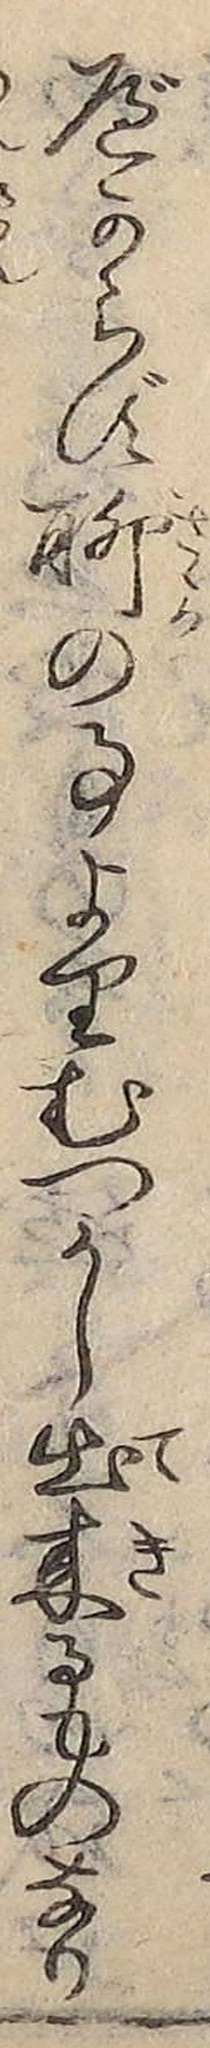べからず聊の事よりむつかし出来るものなり
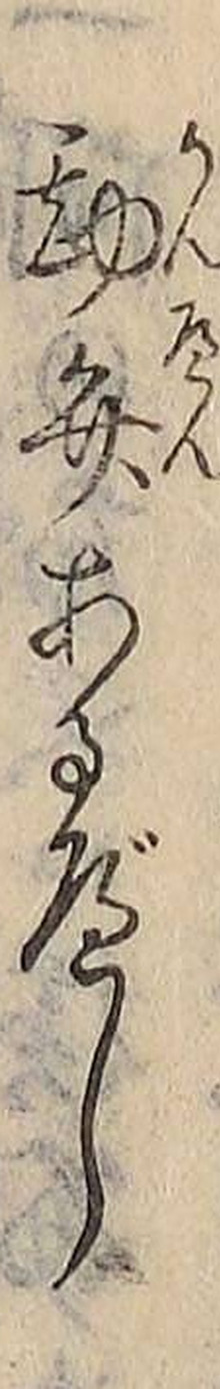勘弁あるべし

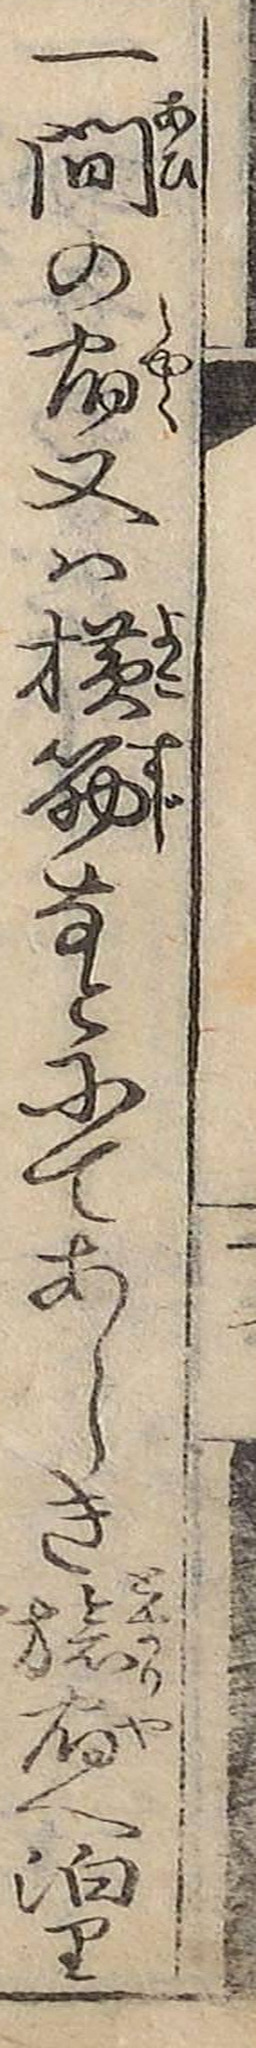一間の宿又は横筋なとにてあしき旅宿へ泊り
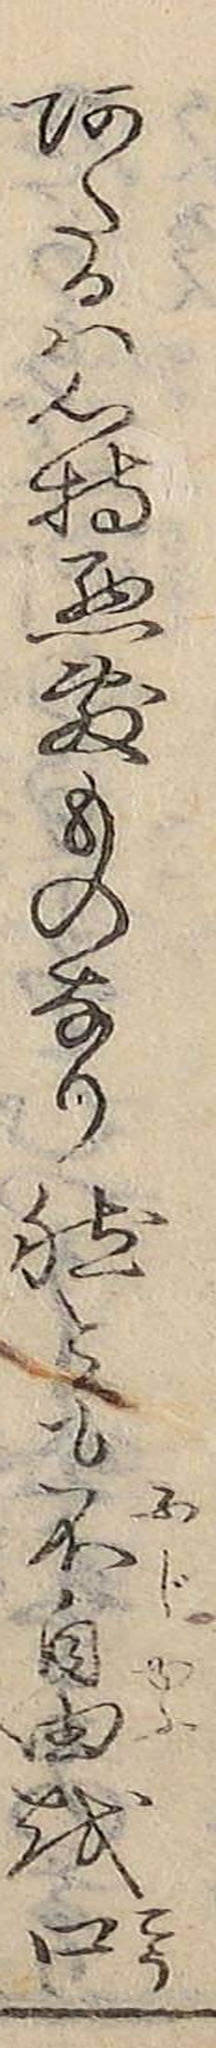あたるは心持悪敷ものなり然とも不自由を口
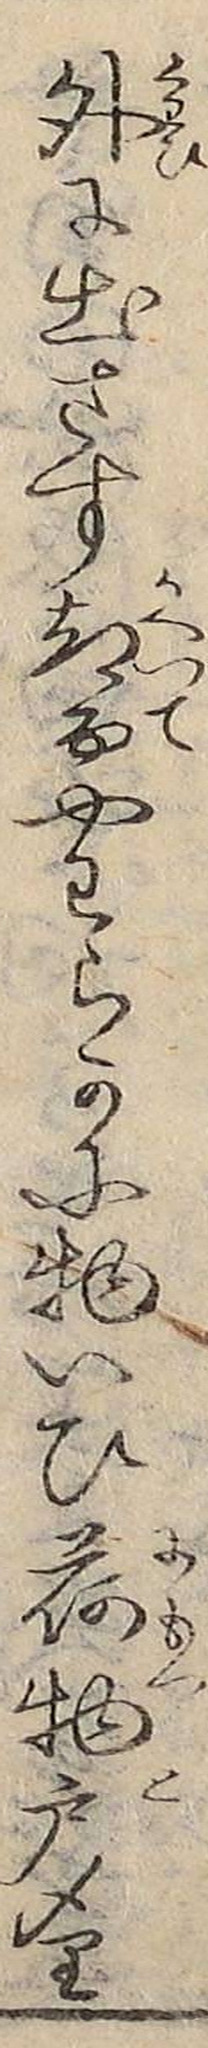外に出さす却而やわらかに物いひ荷物戸〆り
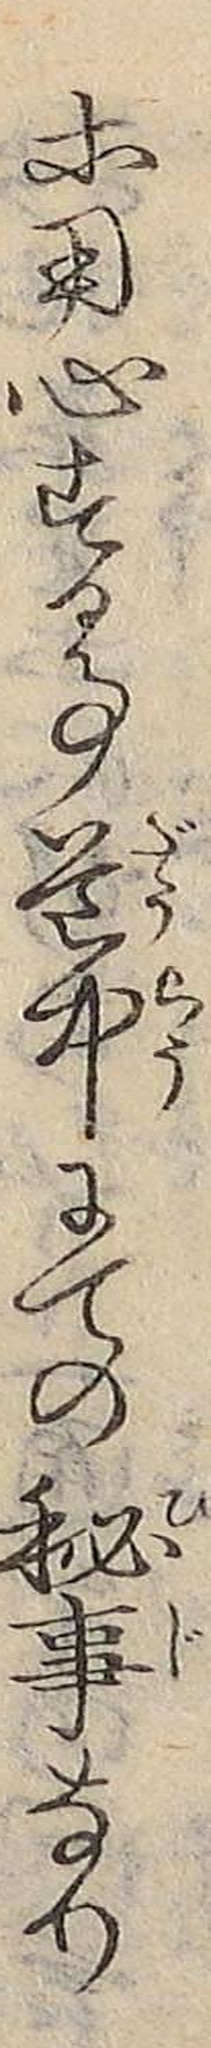等用心する事道中にての秘事なり
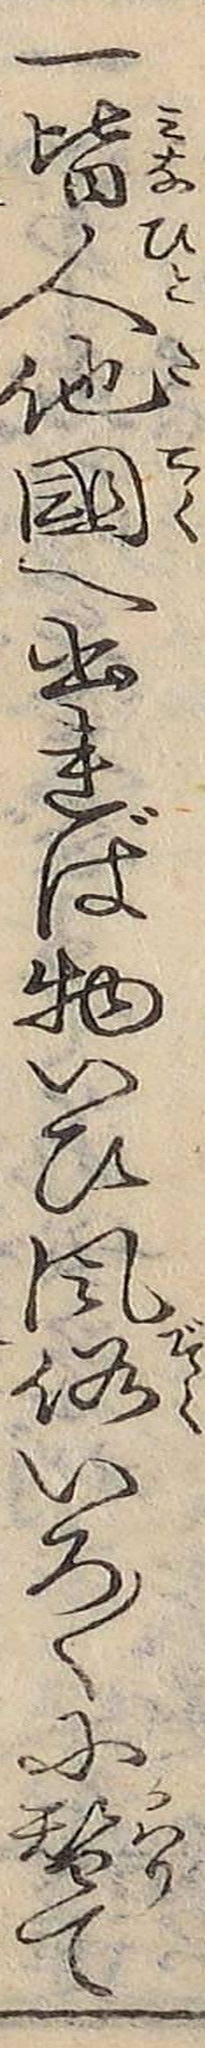一皆人他国へ出れば物いひ風俗いろ〳〵に替て
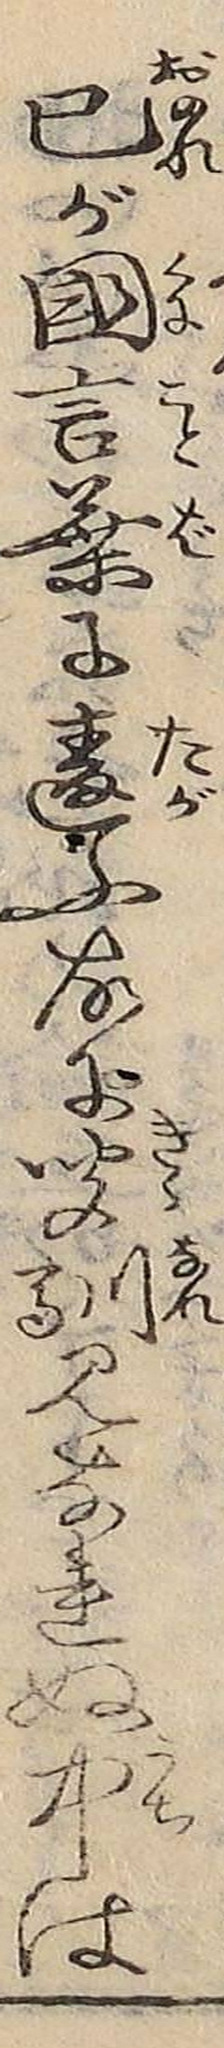已が国言葉に違ふ故に聞馴見なれぬ中は
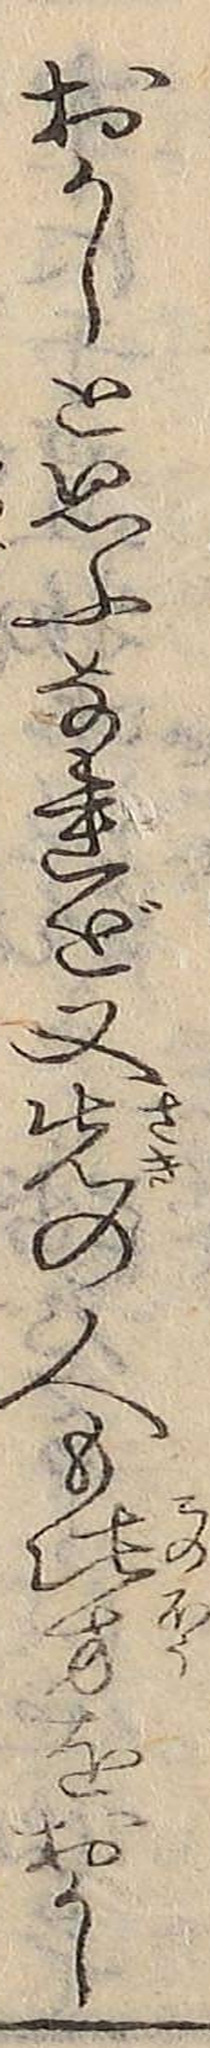おかしと思ふなれど又先の人も此方をおかし
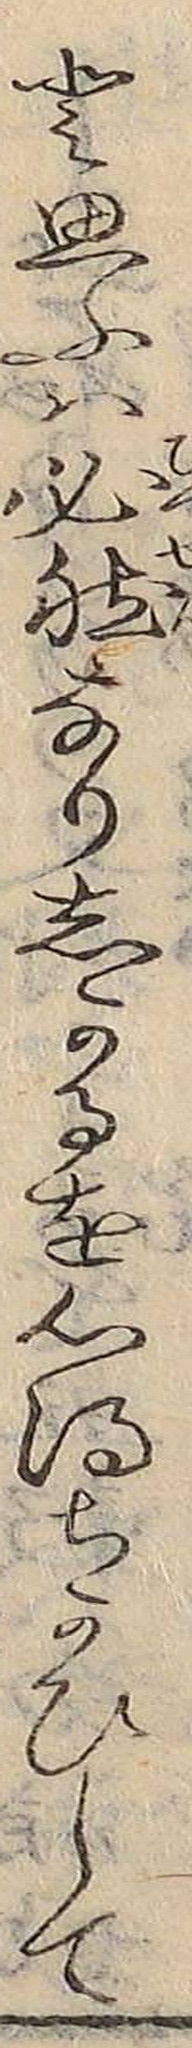と思ふは必然なりしかるを心得ちかひして
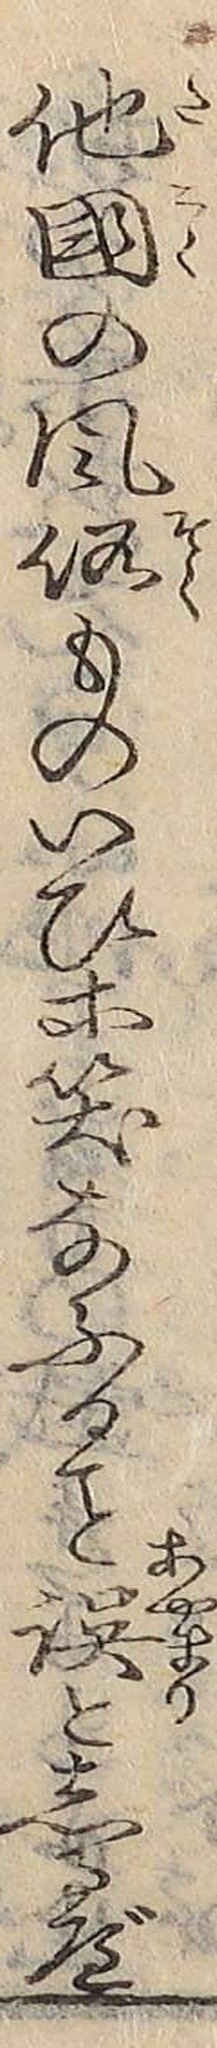他国の風俗ものいひ等笑なふること誤としるべ
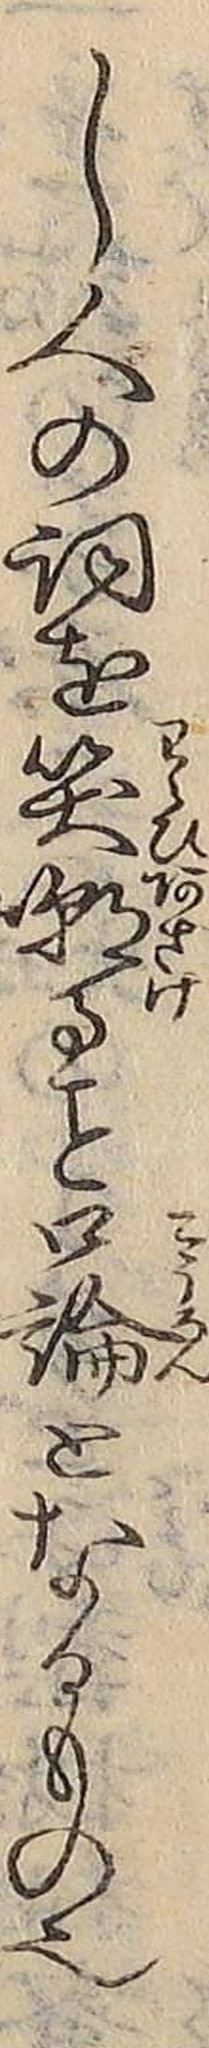し人の詞を笑嘲ること口論となるもの也
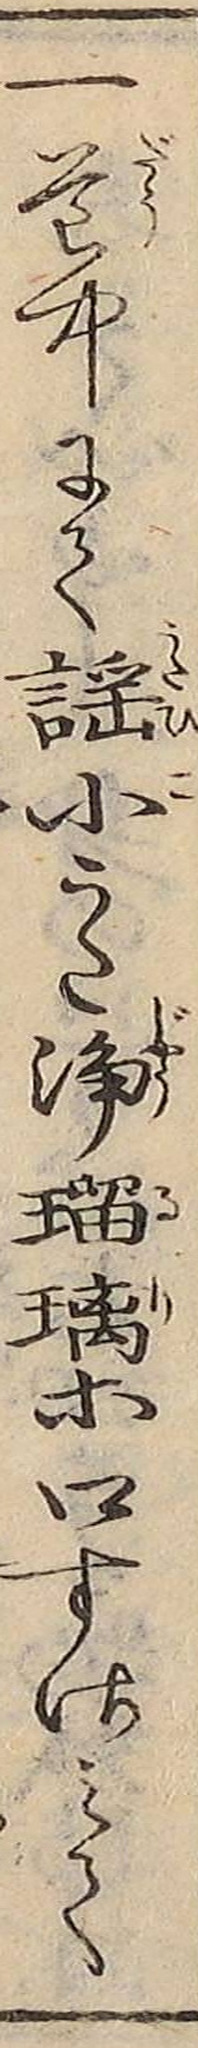一道中にて謡小うた浄瑠璃等口すさみて
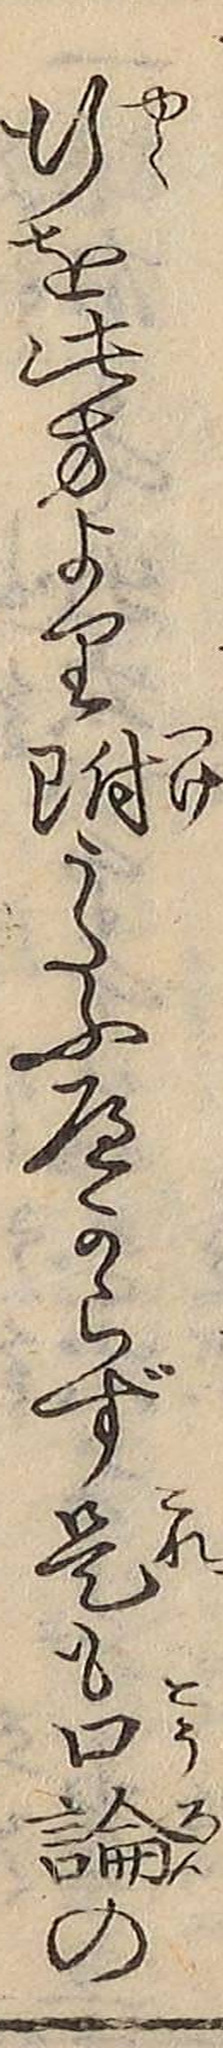行を此方より附うたふへからず是も口論の
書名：旅行用心集
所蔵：神戸大学附属図書館 国文学研究資料館
